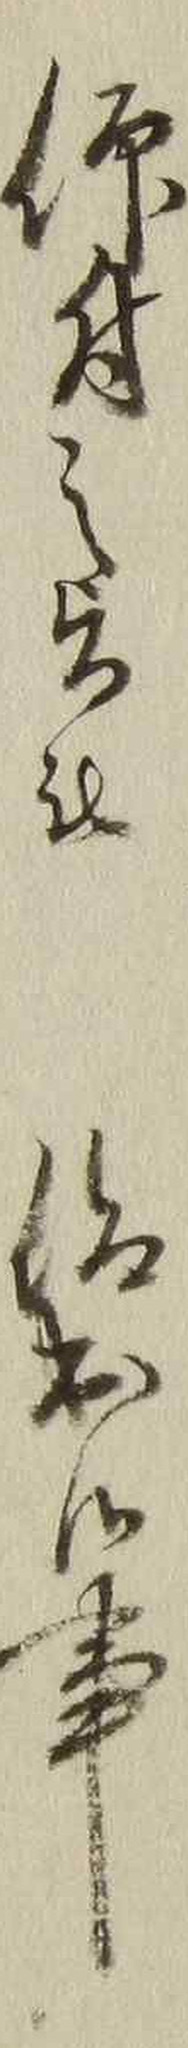仰付之旨被仰出候事
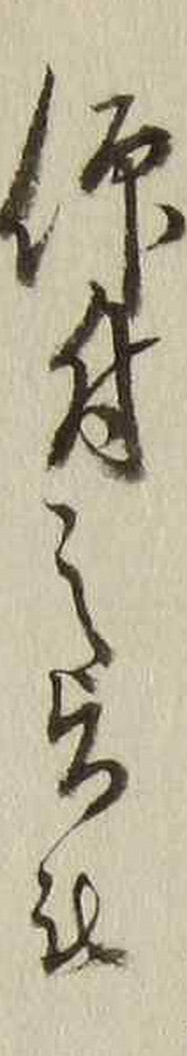仰付之旨被仰出候事
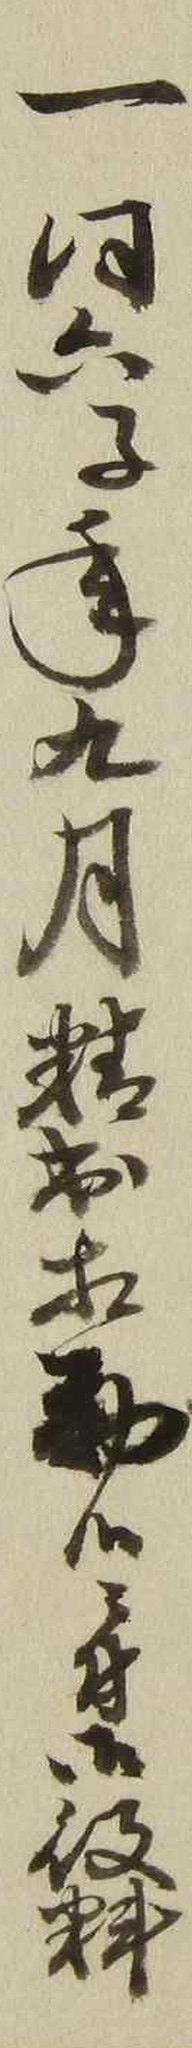一同六子年九月精出相勤候ニ付御役料
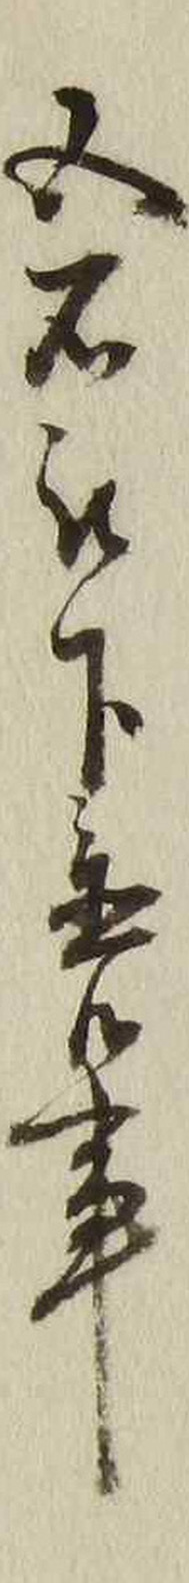五石被下置候事
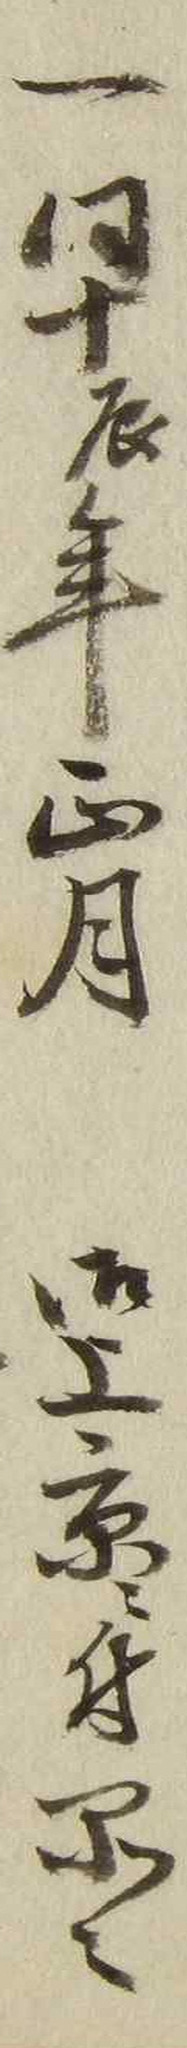一同十辰年正月御上京ニ付品々
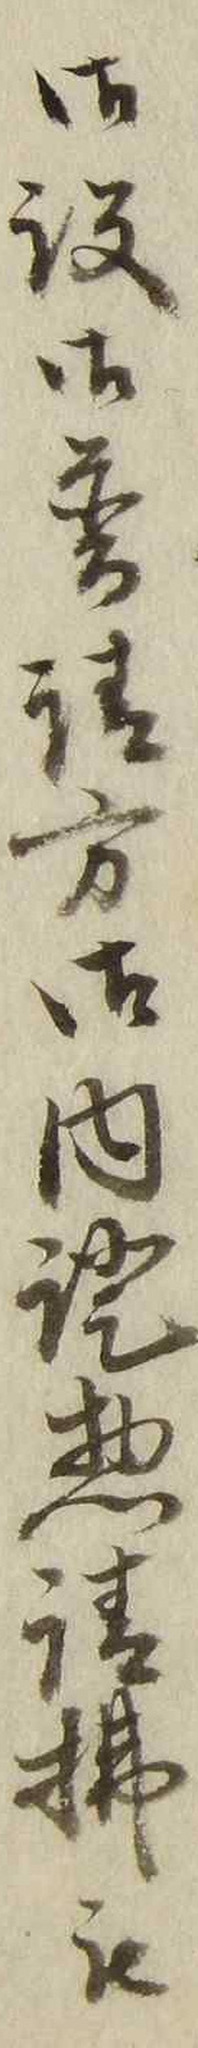御役御普請方御内証惣請払被

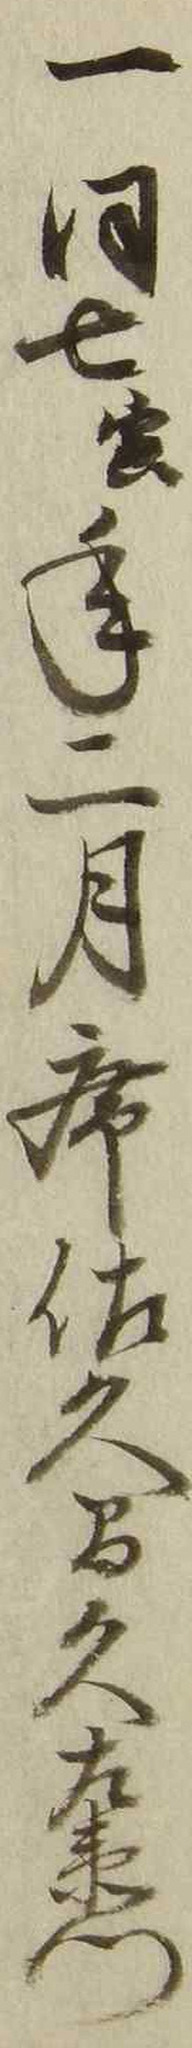一同七寅年二月席佐久間久左衛門
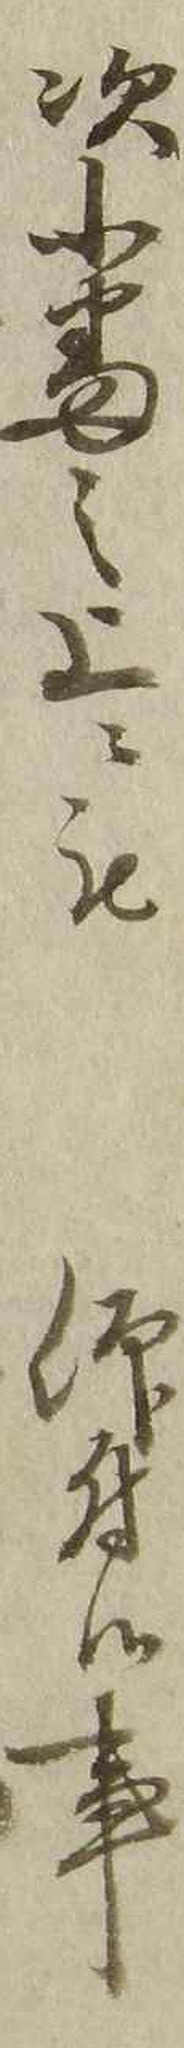次小番之上ニ被仰付候事
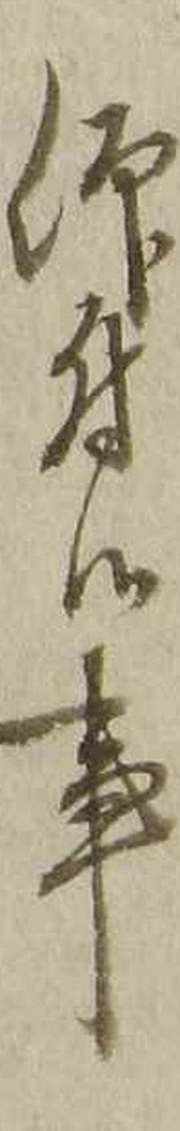仰付候事
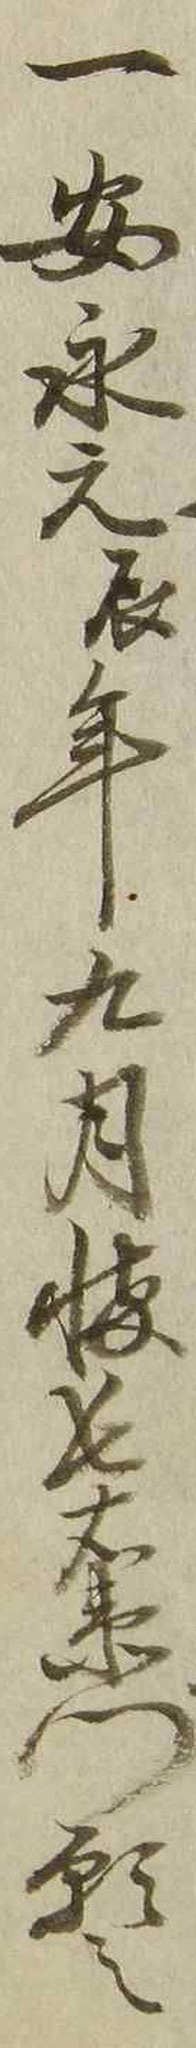一安永元辰年九月忰長右衛門願之
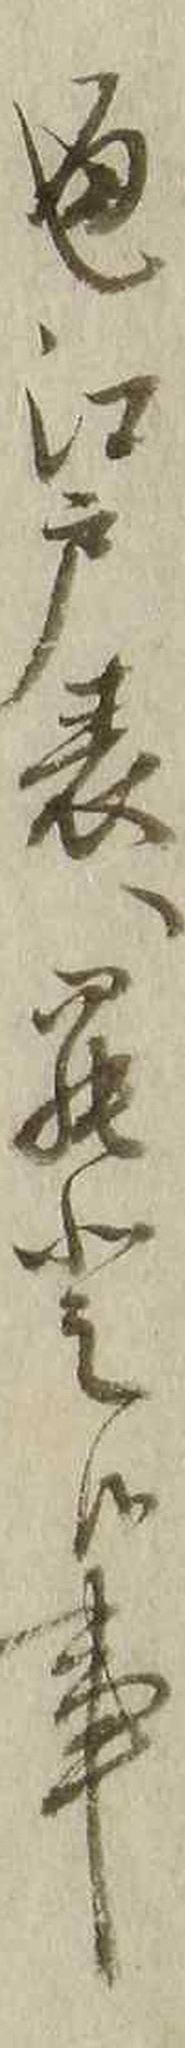通江戸表へ罷登候事
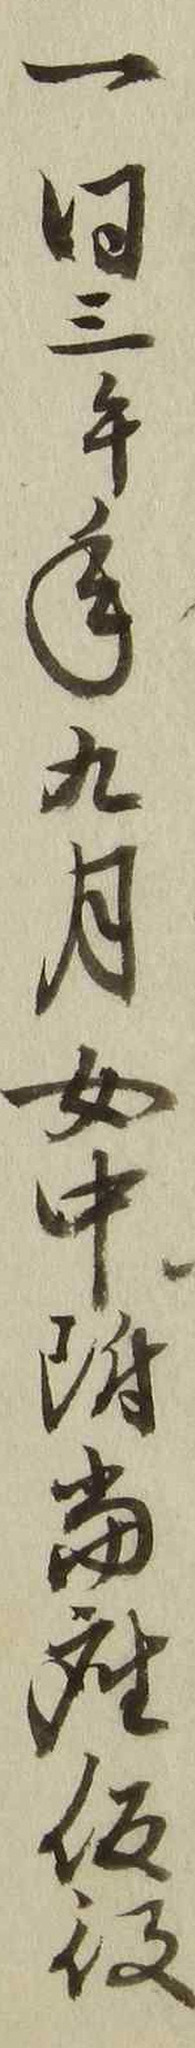一同三午年九月女中附当座仮役
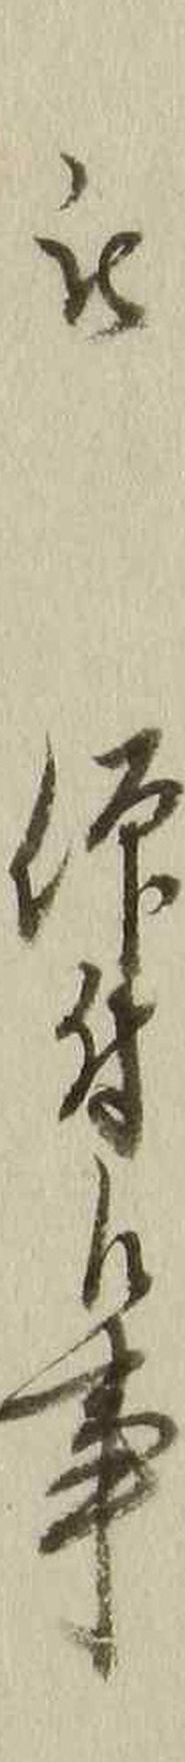被仰付候事
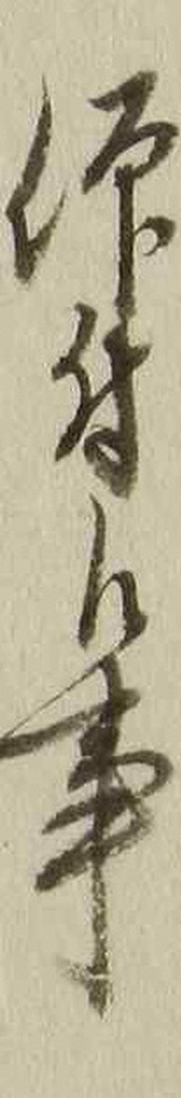仰付候事
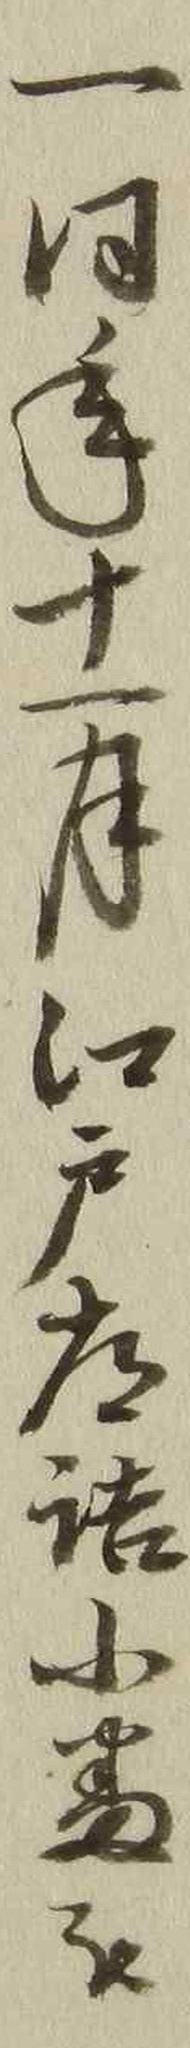一同年十一月江戸常詰小番被
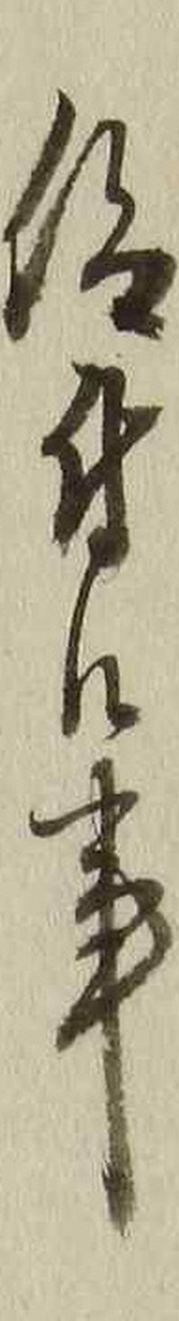仰付候事
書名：諸士系譜　巻之53　に之部4
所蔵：会津若松市立会津図書館
